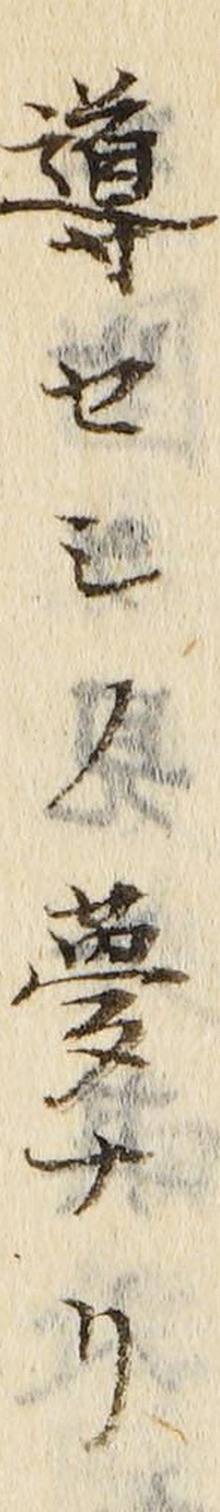導セシノ夢ナリ
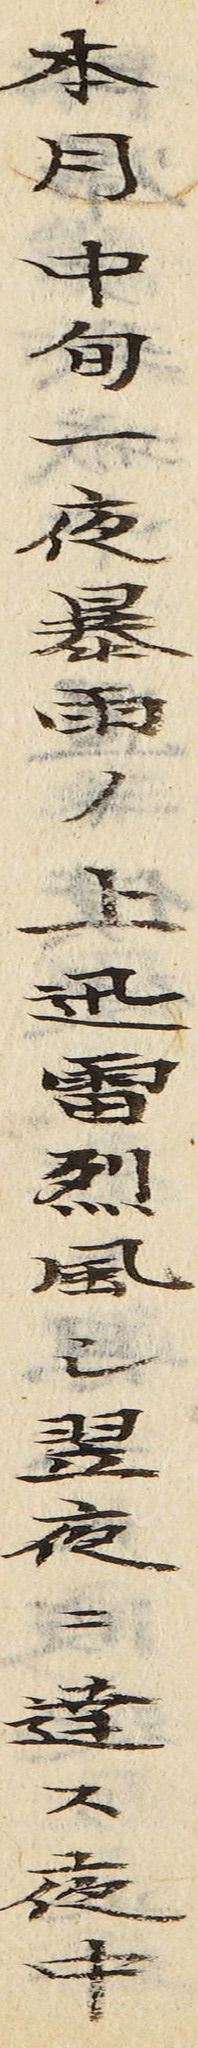本月中旬一夜暴雨ノ上迅雷烈風シ翌夜ニ達ス夜中
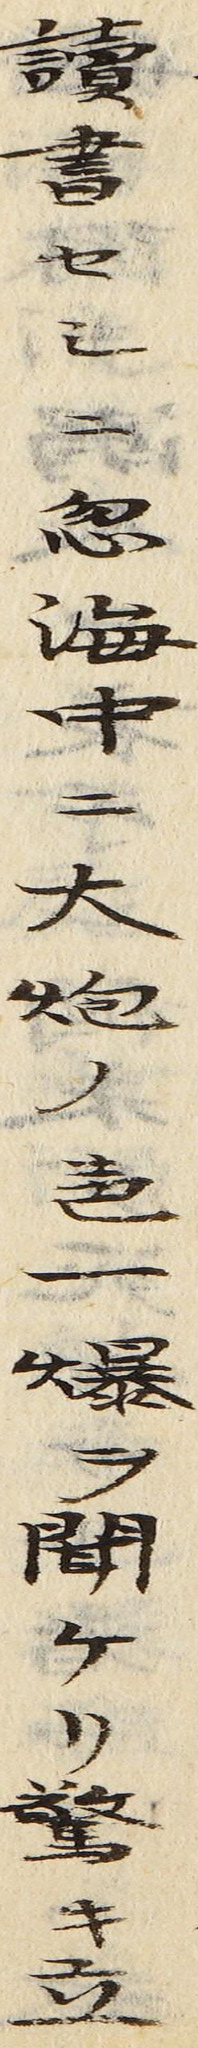読書セシニ忽海中ニ大炮ノ声一爆ヲ聞ケリ驚キ立
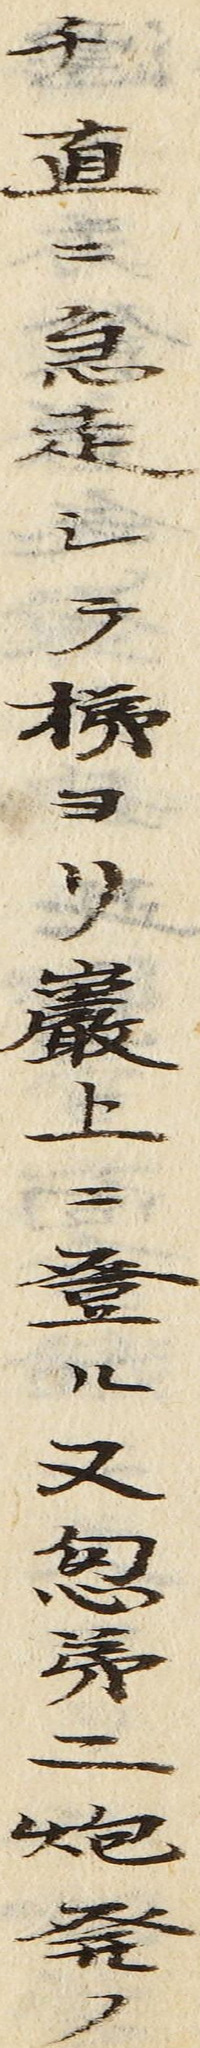チ直ニ急走シテ梯ヨリ巌上ニ登ル又忽第二炮発ノ
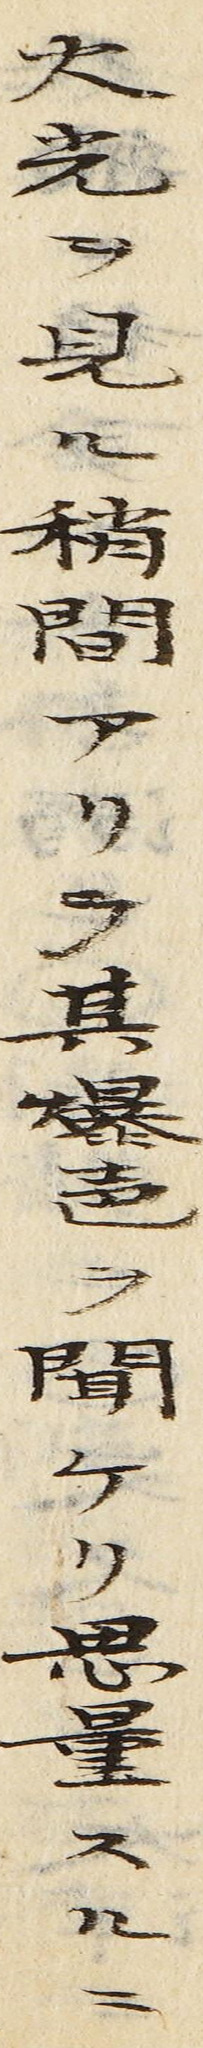火光ヲ見ル稍間アリテ其爆声ヲ聞ケリ思量スルニ
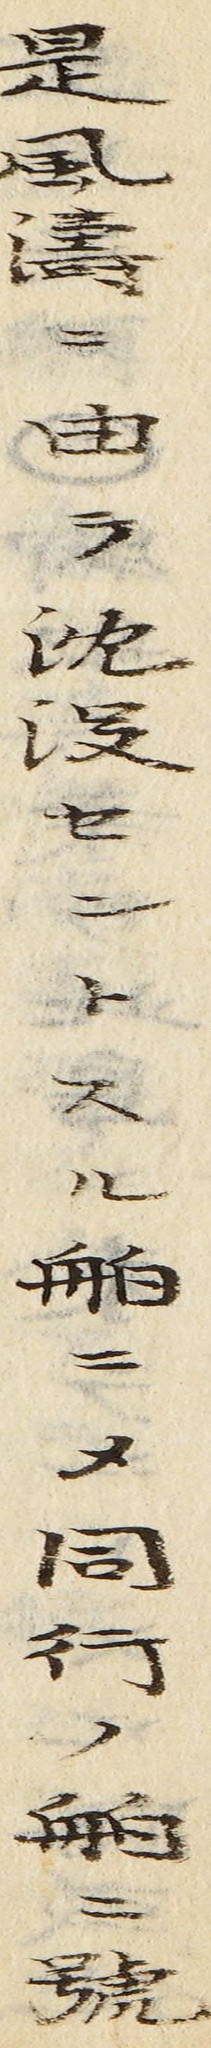是風濤ニ由テ沈没セントスル舶ニシテ同行ノ舶ニ號
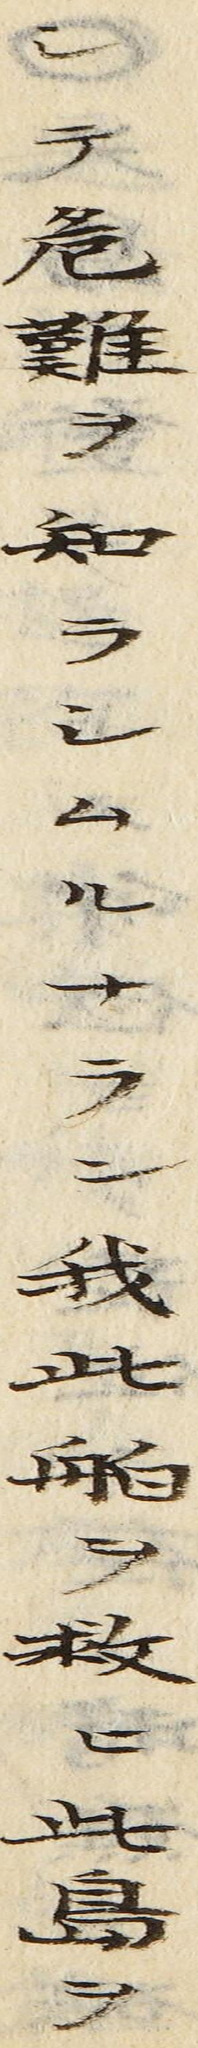シテ危難ヲ知ラシムルナラン我此舶ヲ救ヒ此島ヲ
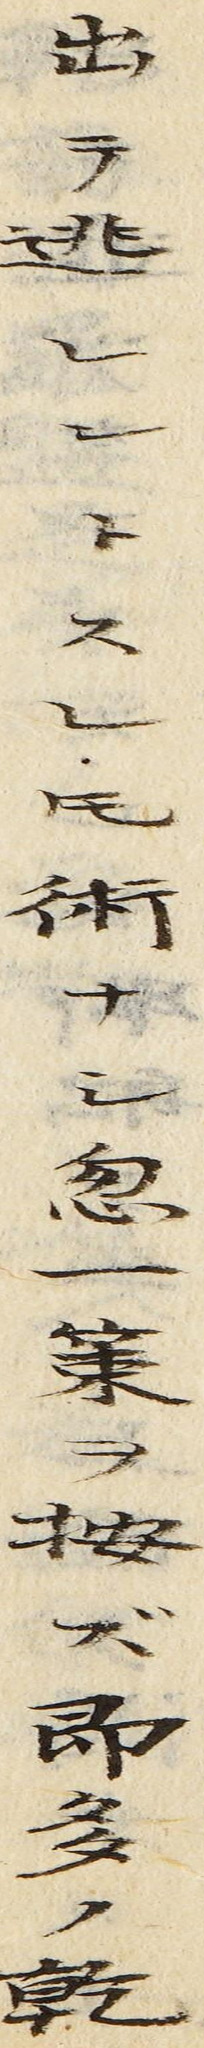出テ逃レントスレトモ術ナシ忽一策ヲ按ズ即多ノ乾
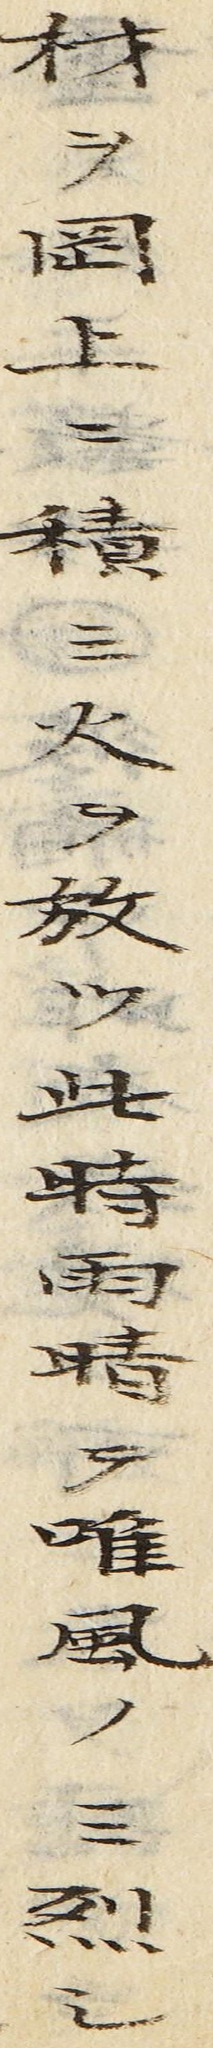材ヲ岡上ニ積ミ火ヲ放ツ此時雨晴テ唯風ノミ烈シ
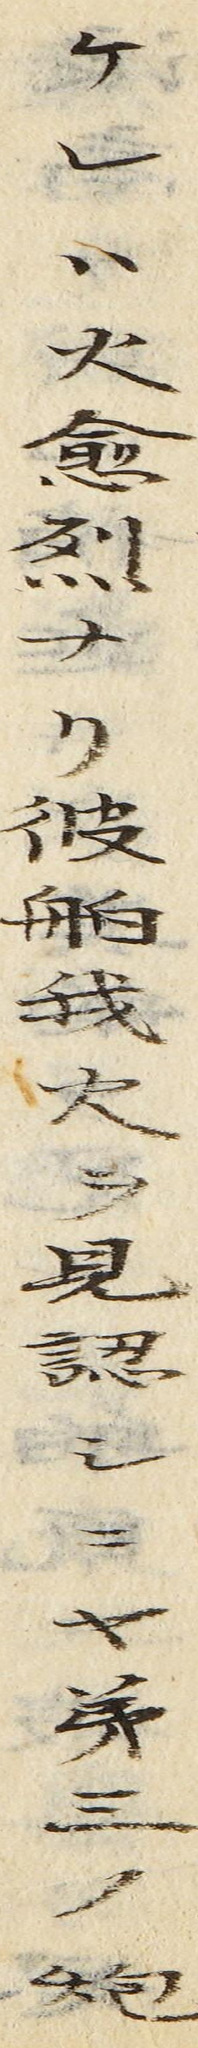ケレハ火愈烈ナリ彼舶我火ヲ見認シニヤ第三ノ炮
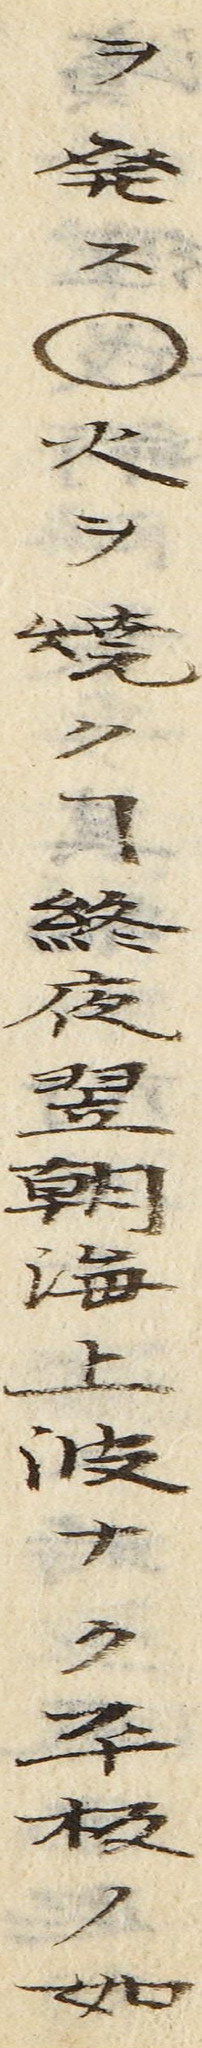ヲ発ス◯火ヲ焼クコト終夜翌朝海上波ナク平板ノ如
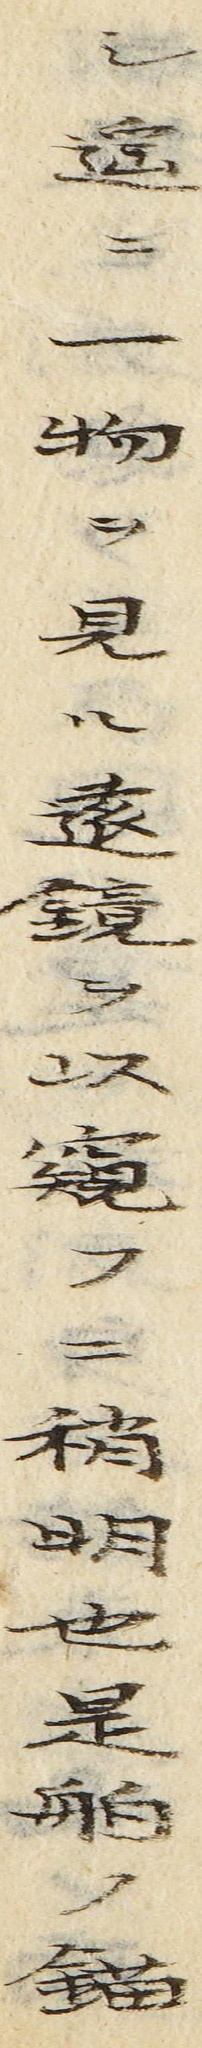シ遥ニ一物ヲ見ル遠鏡ヲ以窺フニ稍明也是舶ノ錨

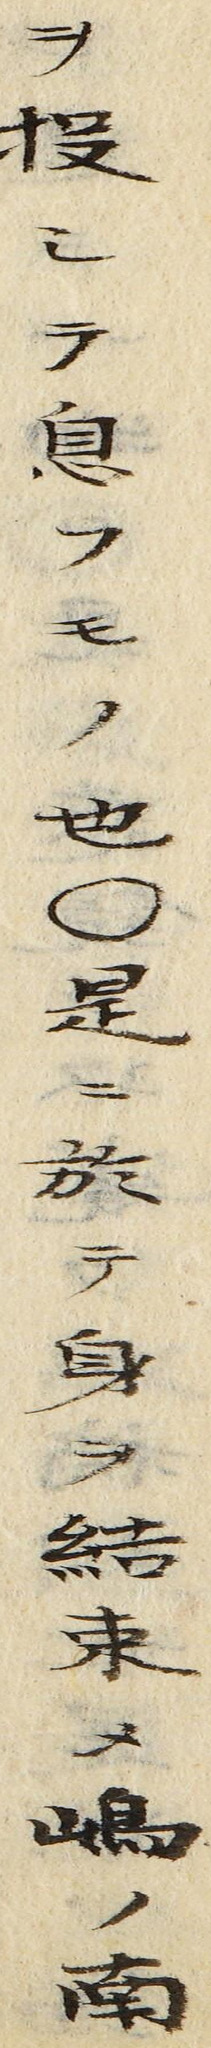ヲ投シテ息フモノ也◯是ニ於テ身ヲ結束シテ嶋ノ南
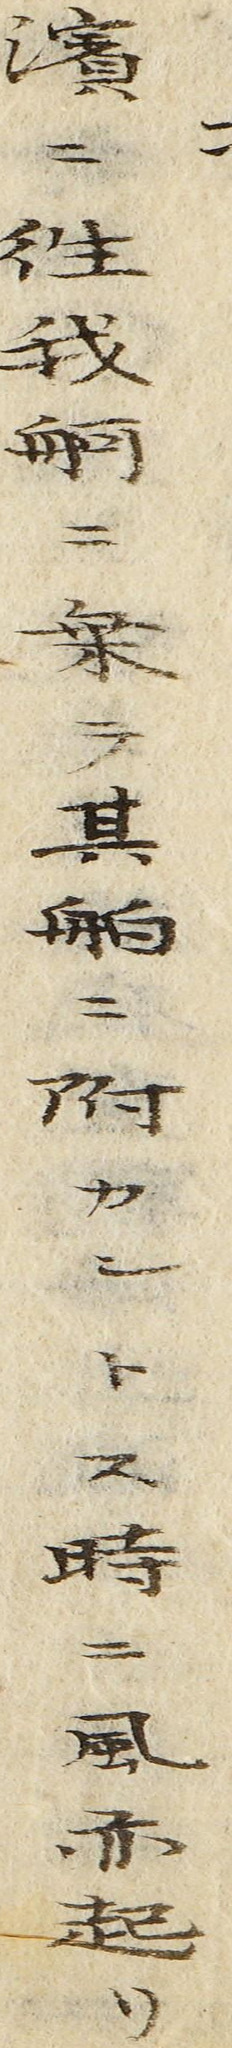浜ニ往我舸ニ乗テ其舶ニ附カントス時ニ風亦起リ
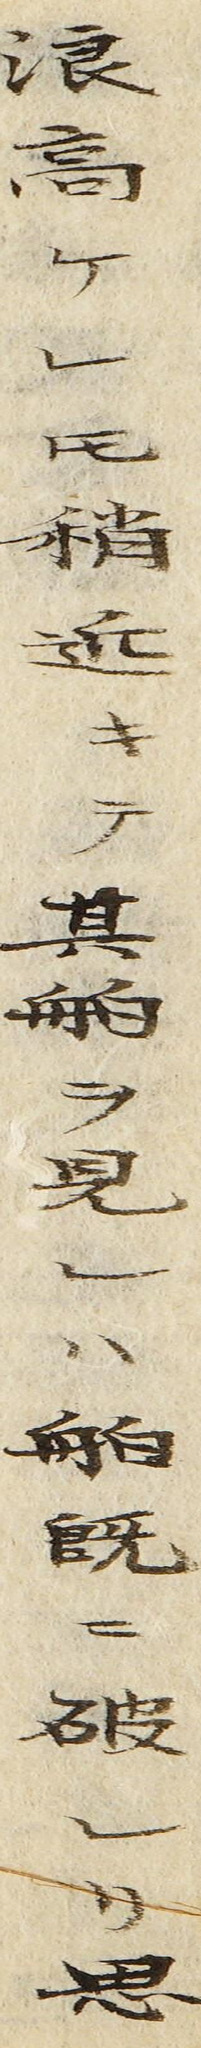浪高ケレトモ稍近キテ其舶ヲ見レハ舶既ニ破レリ思
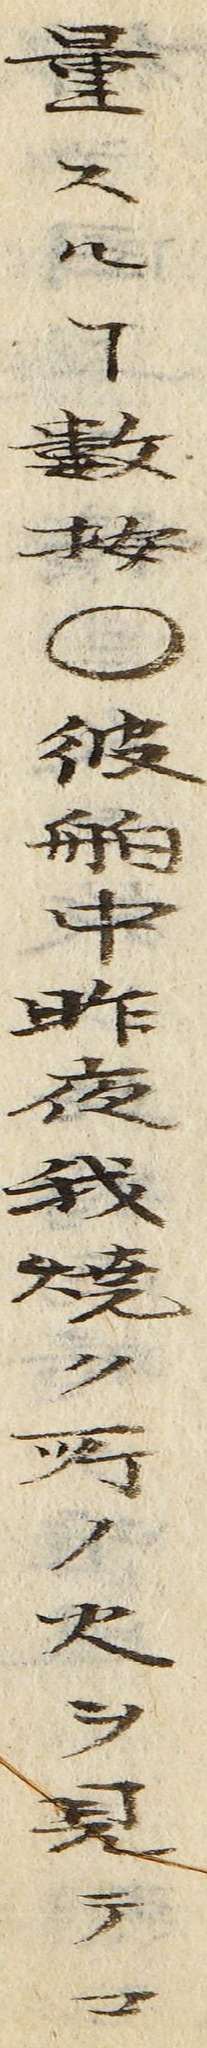量スルコト数按◯彼舶中昨夜我焼ク所ノ火ヲ見テコ
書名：漂流紀事
